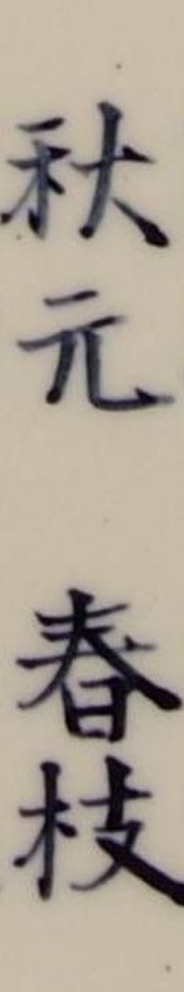秋元春枝
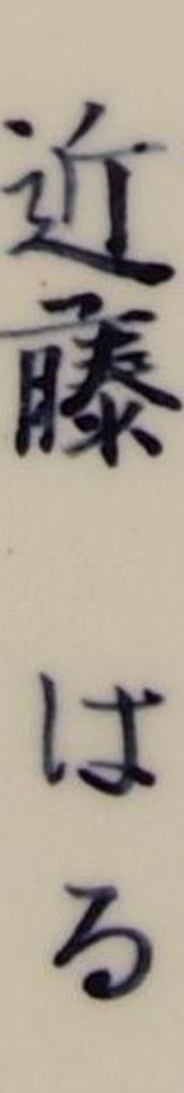近藤はる
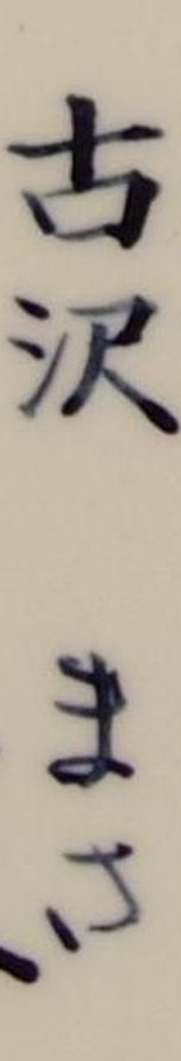古沢まさ
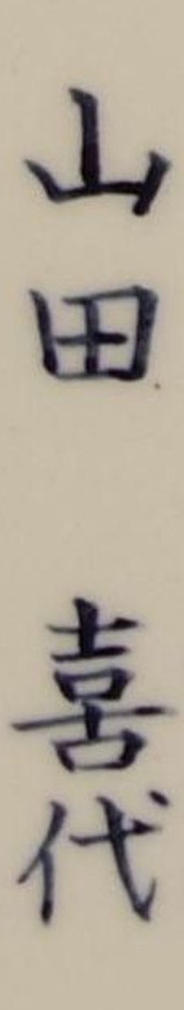山田喜代
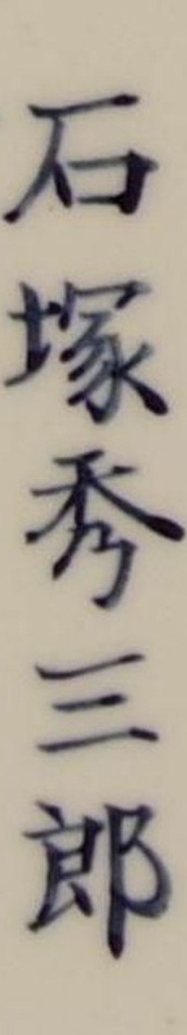石塚秀三郎
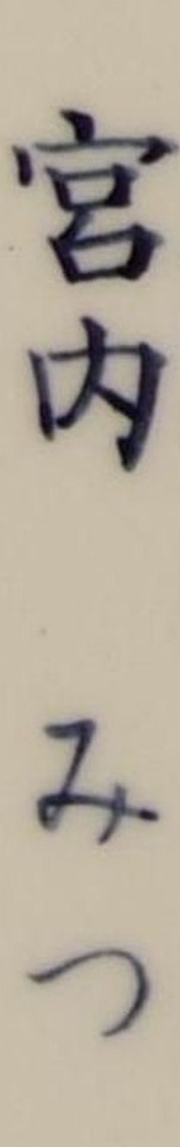宮内みつ
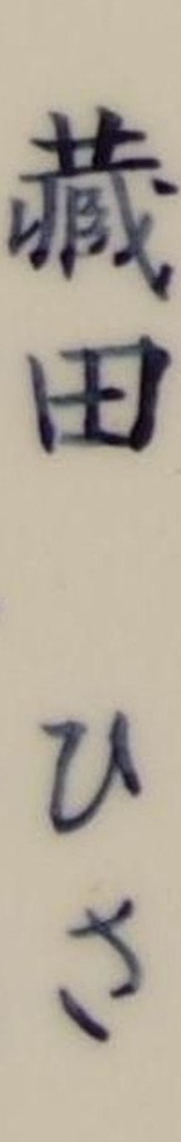蔵田ひさ
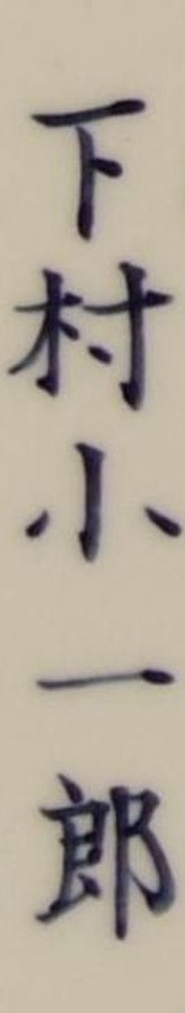下村小一郎
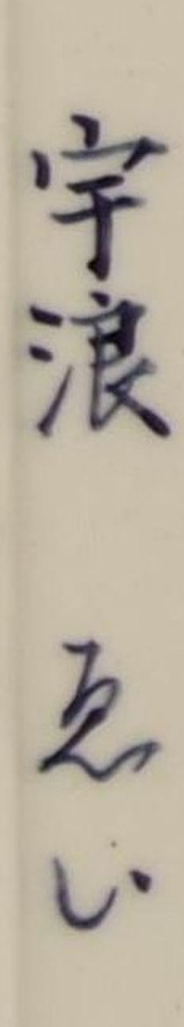宇浪えい

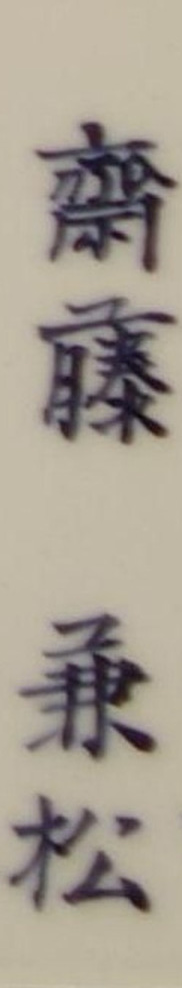斎藤兼松
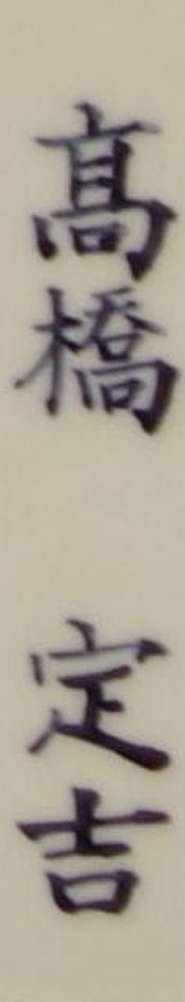高橋定吉
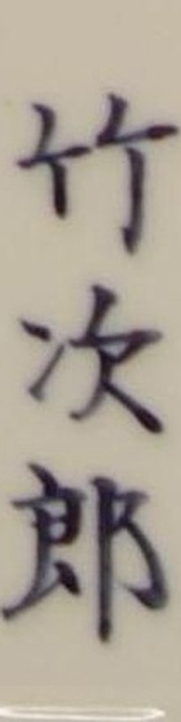竹次郎
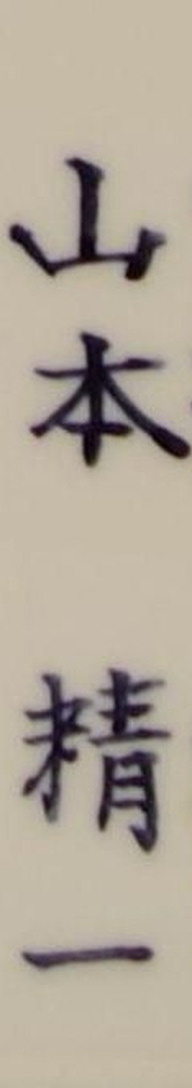山本精一
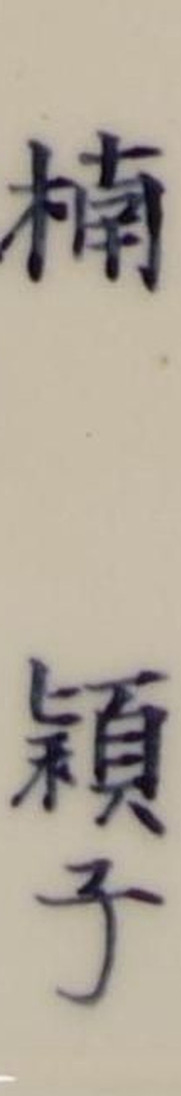楠頴子
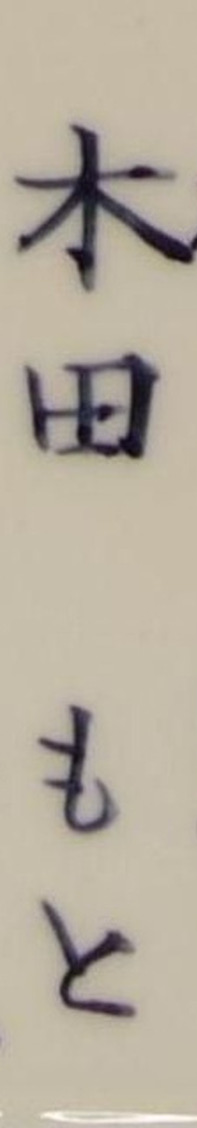木田もと
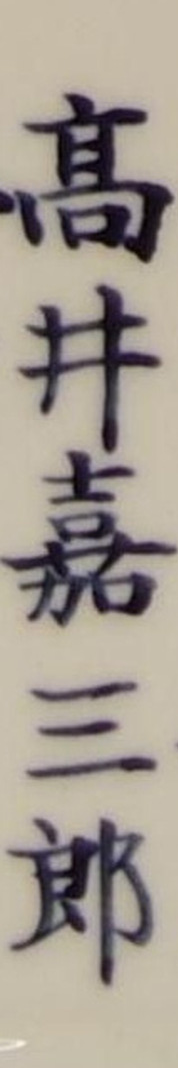高井嘉三郎
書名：E~L
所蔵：高野山金剛峯寺
